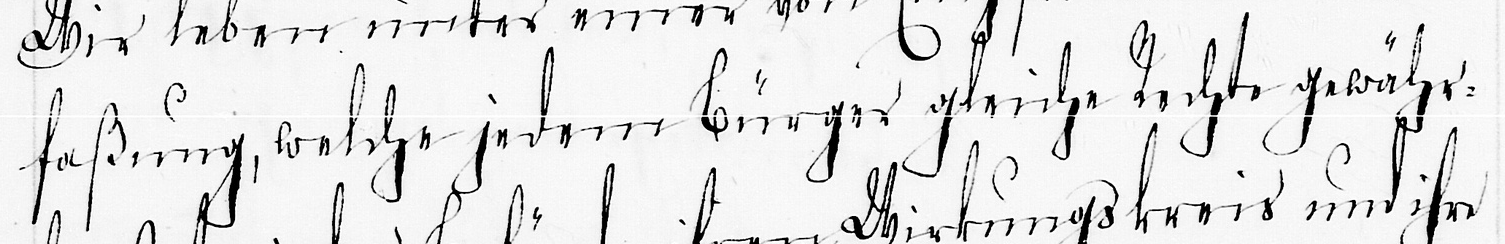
faßung, welche jedem Bürger gleiche Rechte gewähr¬
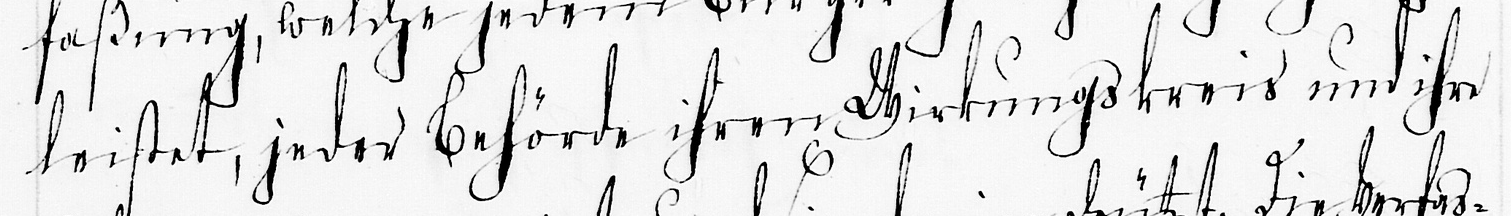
leistet, jeder Behörde ihren Wirkungskreis und ihre
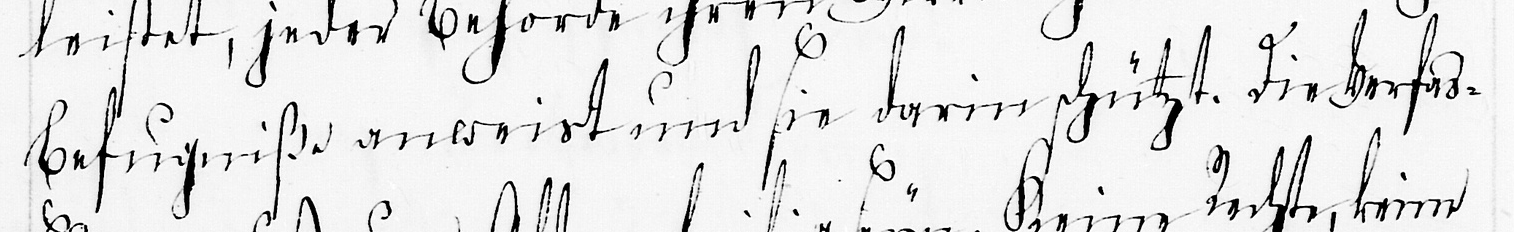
Befugniße anweist und sie darin schützt. Die Verfaß¬
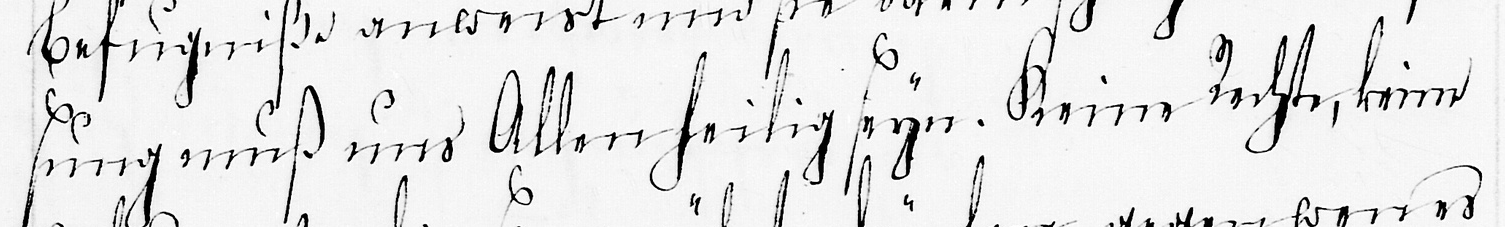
ung muß uns Allen heilig seyn. Keine Rechte, keine
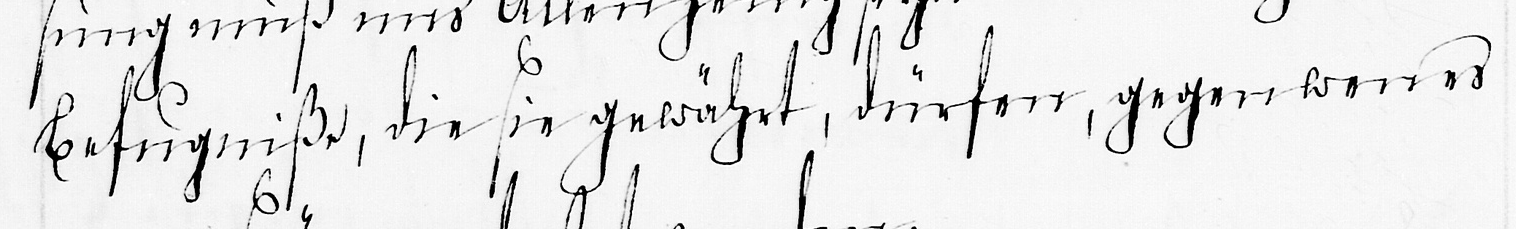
Befugniße, die sie gewährt, dürfen, gegen wen es
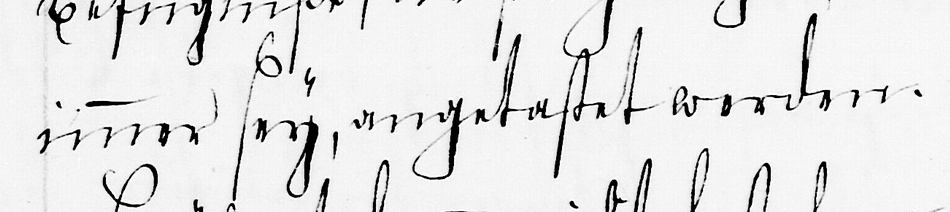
immer sey, angetastet werden.
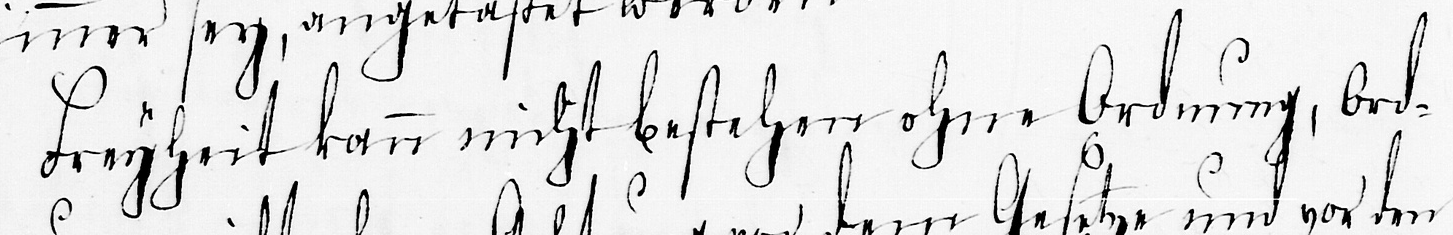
Freyheit kann nicht bestehen ohne Ordnung, Ord¬
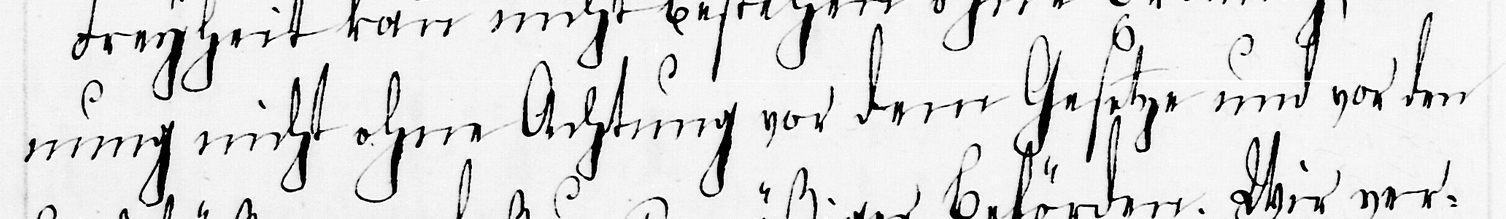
nung nicht ohne Achtung vor dem Gesetze und vor den
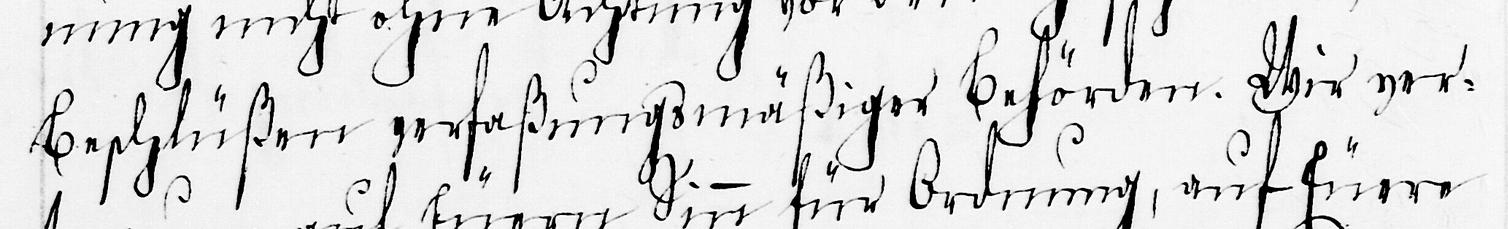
Beschlüßen verfaßungsmäßiger Behörden. Wir ver¬
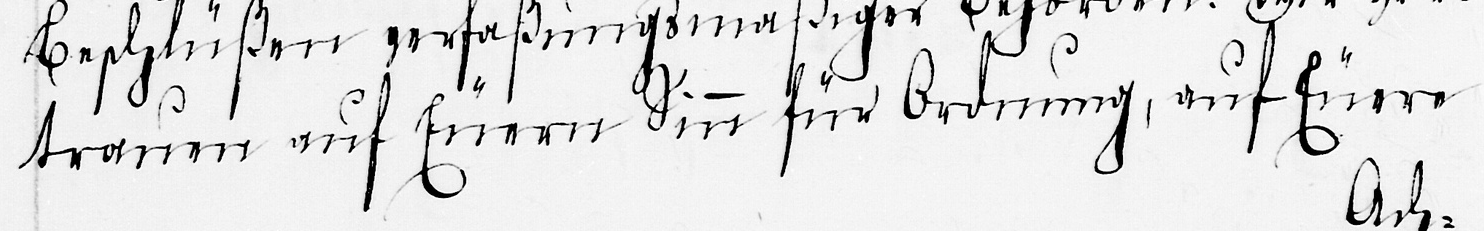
trauen auf Euern Sinn für Ordnung, auf Euere
